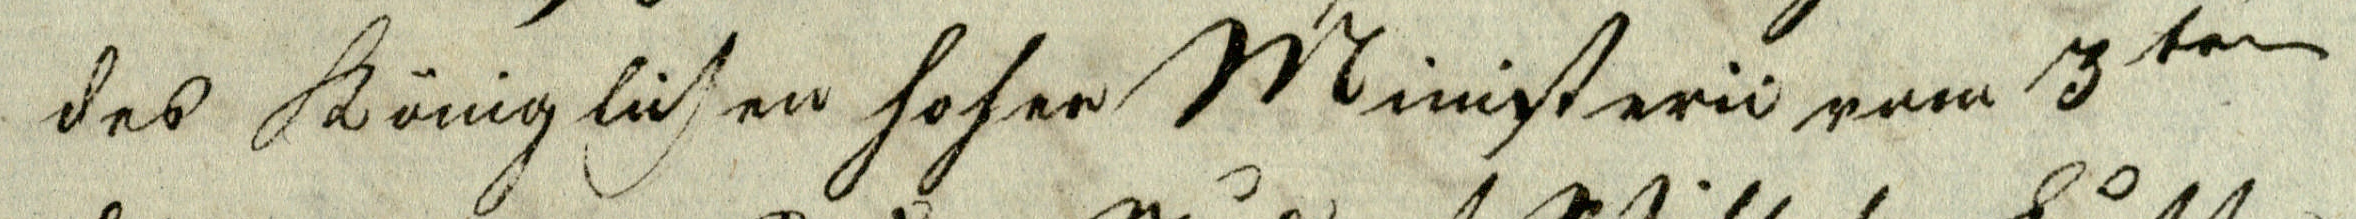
des Königlichen hohen Ministerii vom 3ten
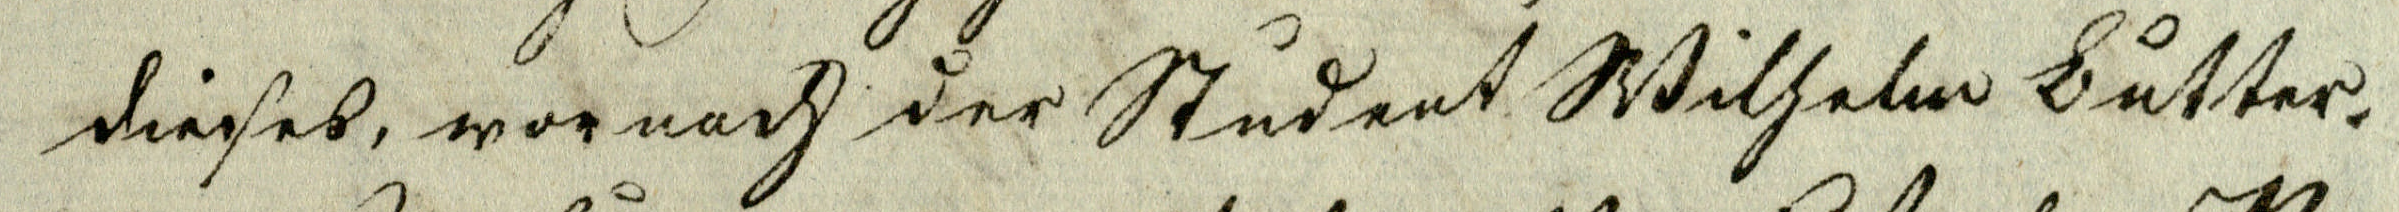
dieses, wornach der Student Wilhelm Butter¬
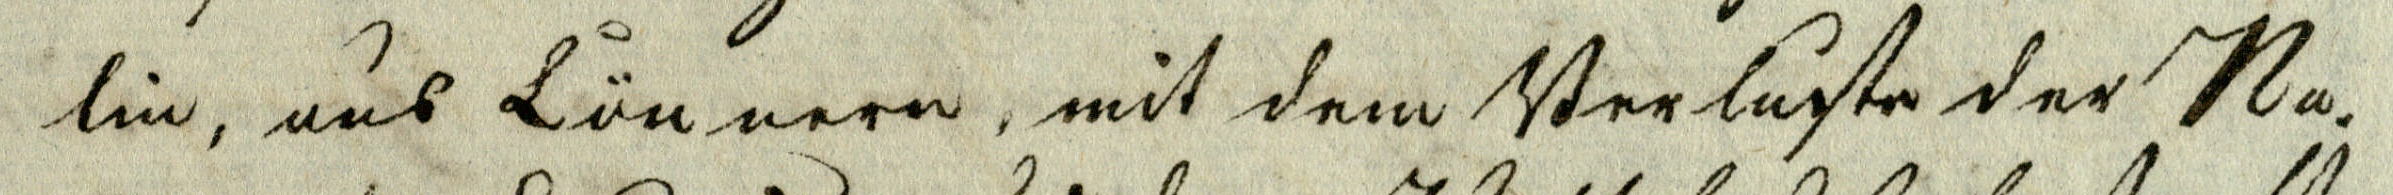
lin, aus Cönnern, mit dem Verluste der Na¬
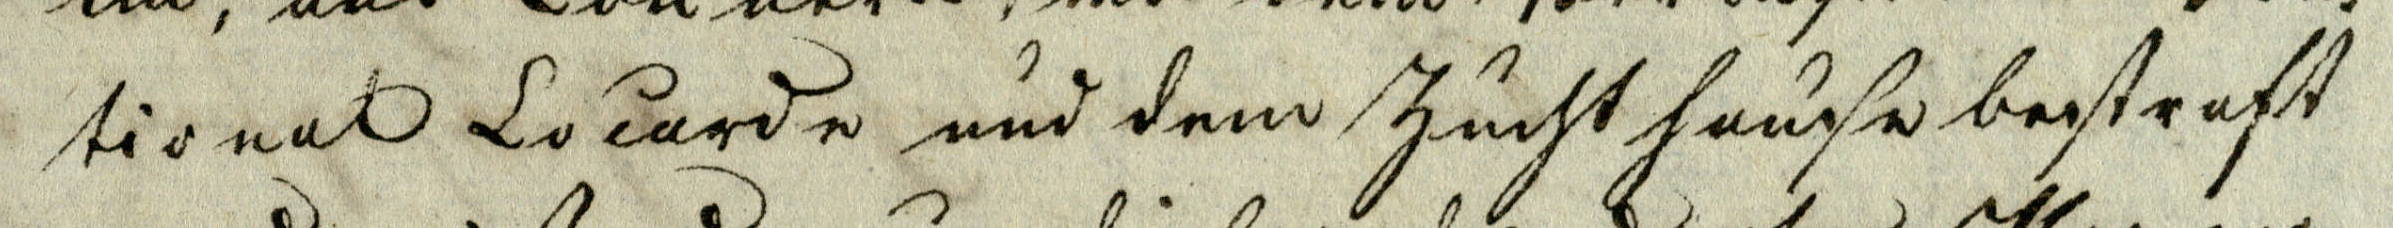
tional Cocarde und dem Zuchthause bestraft
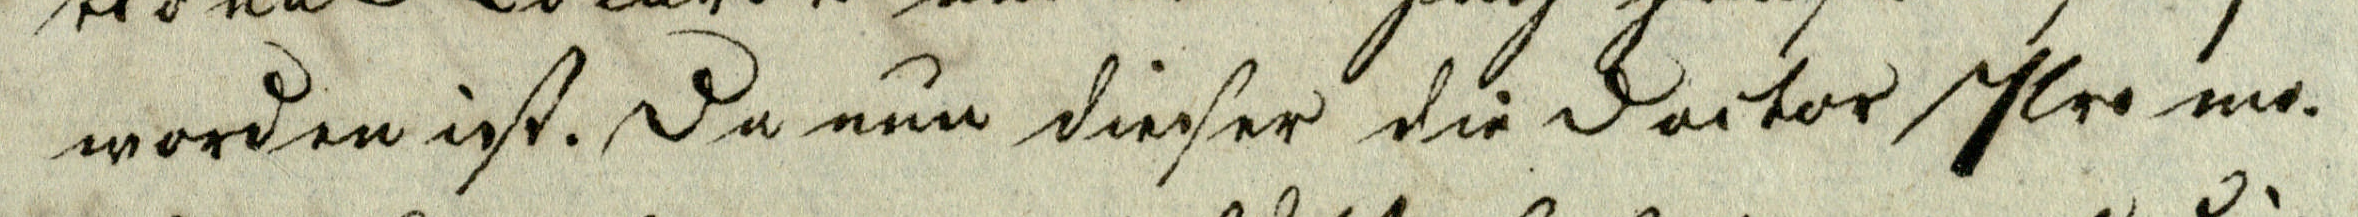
worden ist. Da nun dieser die Doctor Promo¬
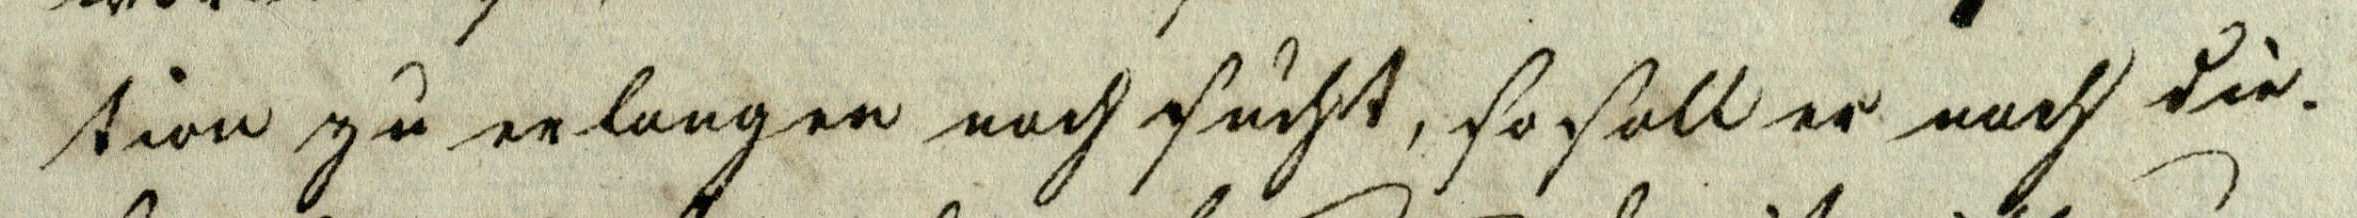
tion zu erlangen nach sucht, so soll er nach die¬
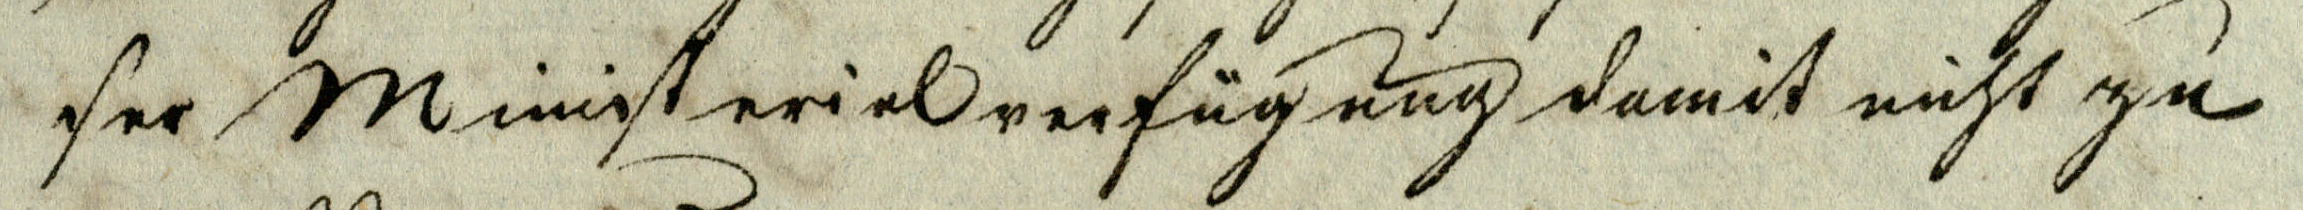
ser Ministerialverfügung damit nicht zu
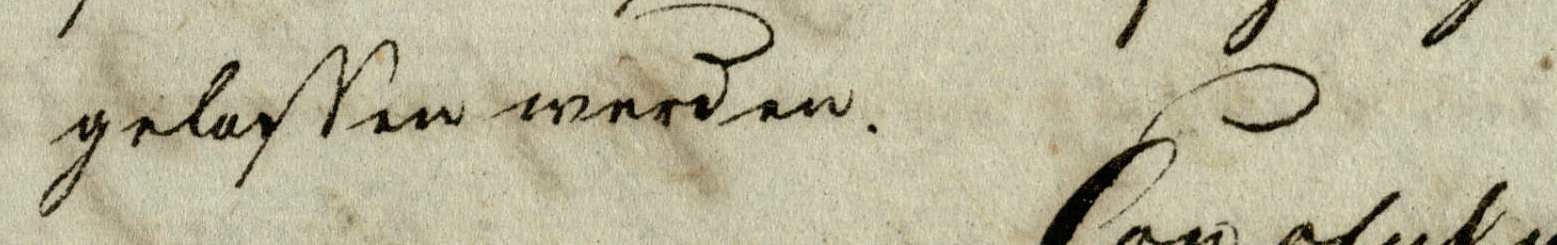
gelassen werden.
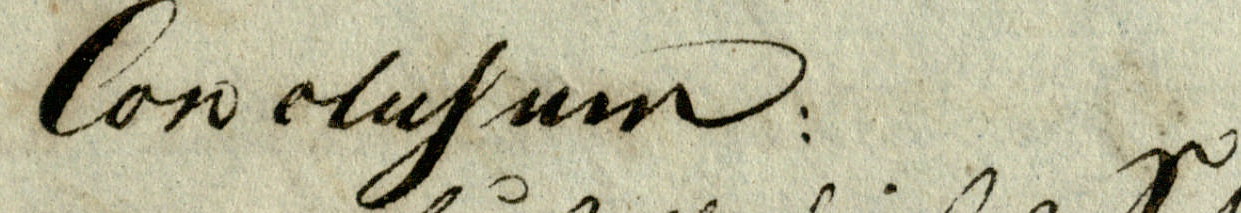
Conclusum:
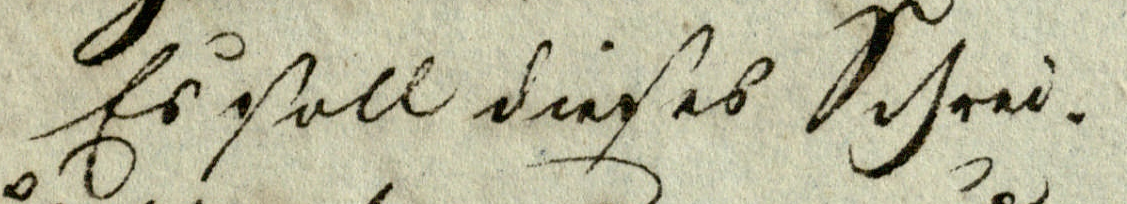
Es soll dieses Schrei¬
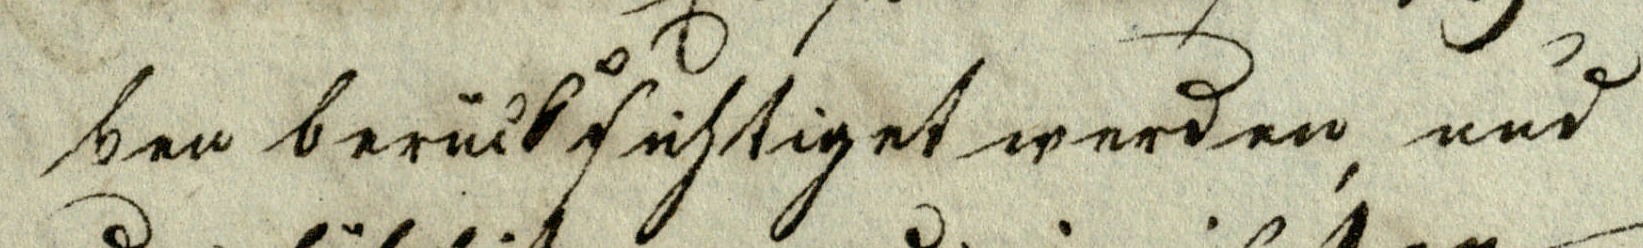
ben berücksichtiget werden, und
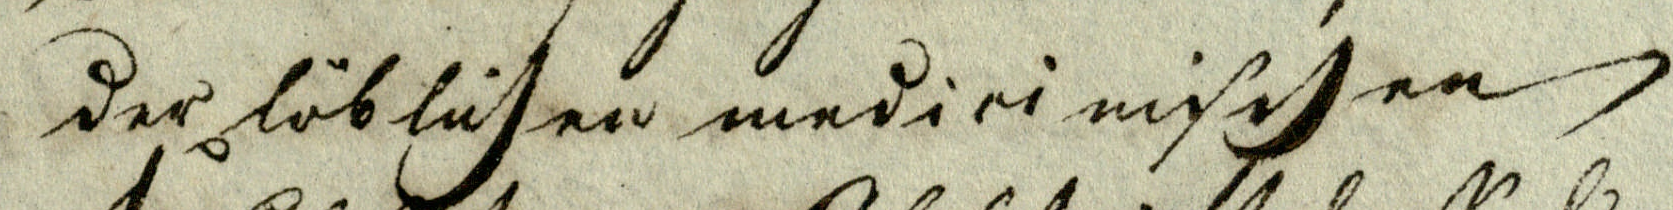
der löblichen medicinischen
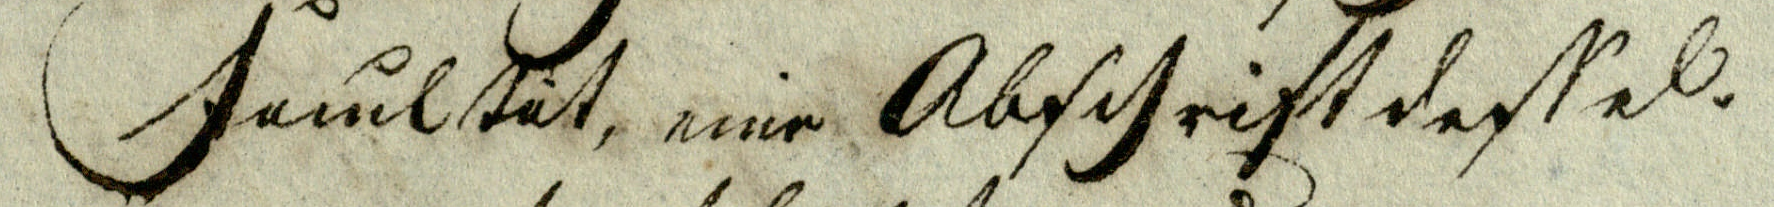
Facultät, ein Abschrift dessel¬
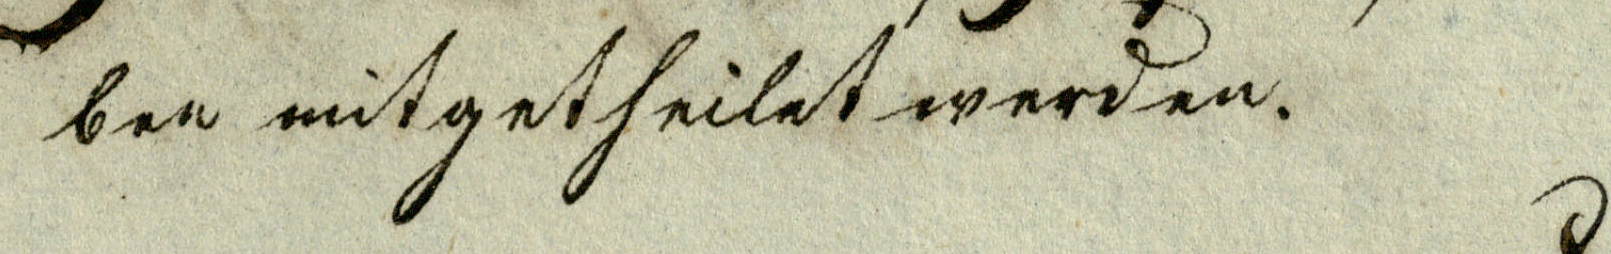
ben mitgetheilet werden.
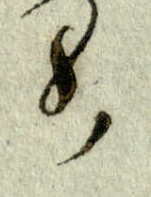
8,
